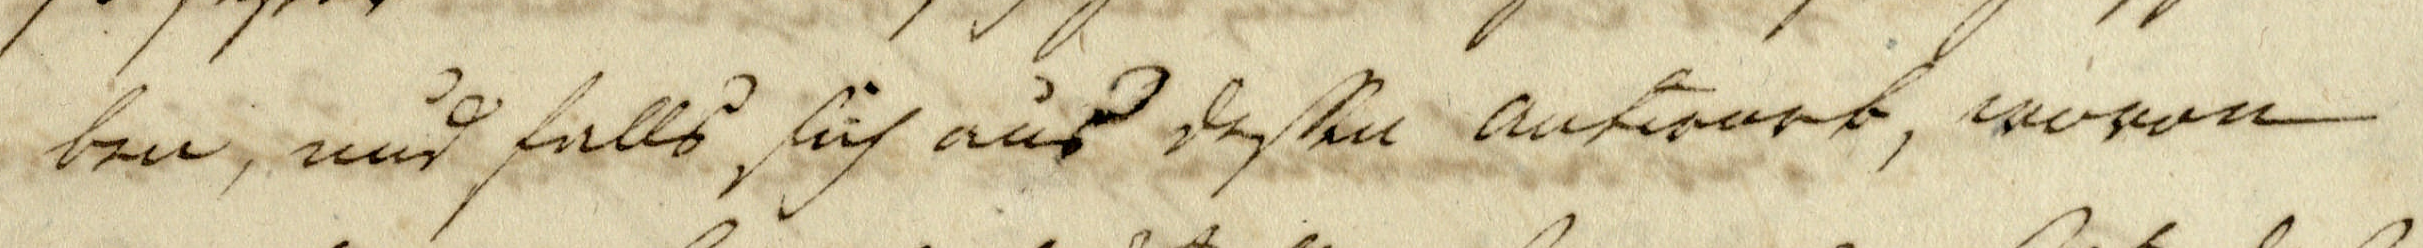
ben, und falls sich aus dessen Antwort, wovon
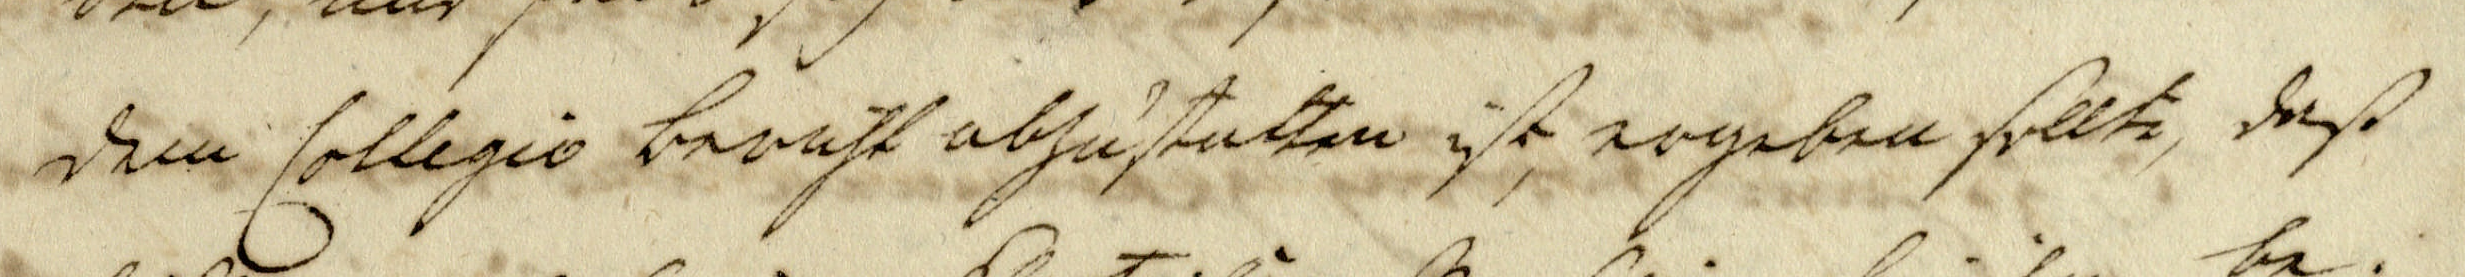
dem Collegio Bericht abzustatten ist, ergeben sollte, daß
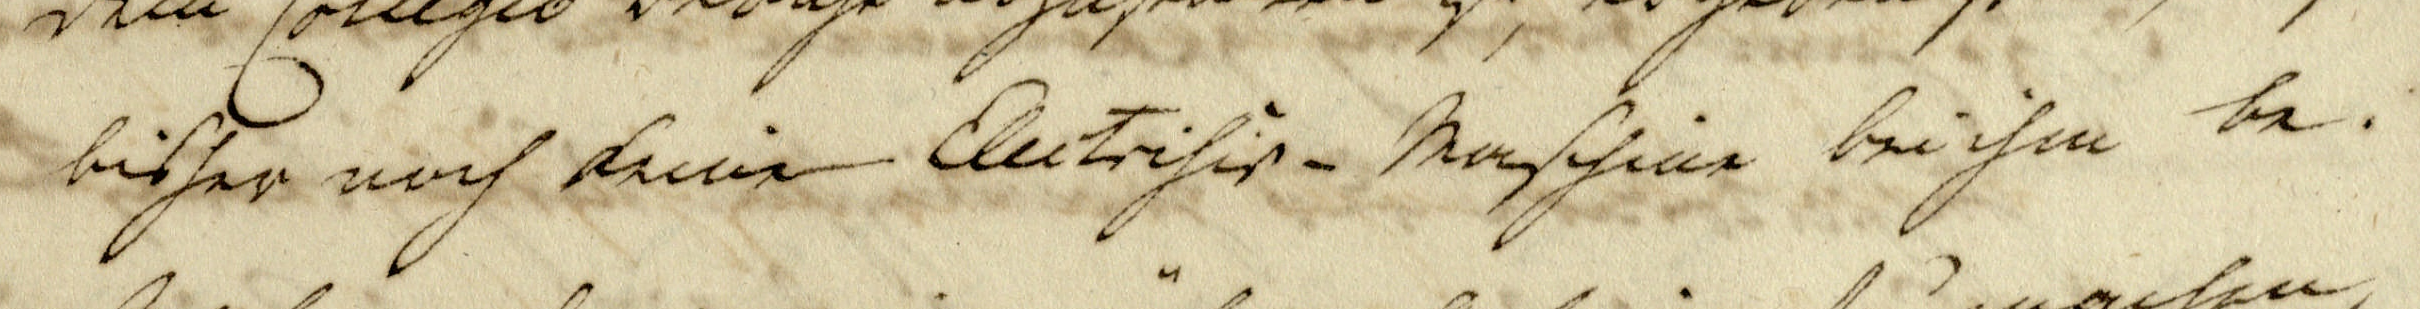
bisher noch keine Electrisir - Maschine bei ihm be¬
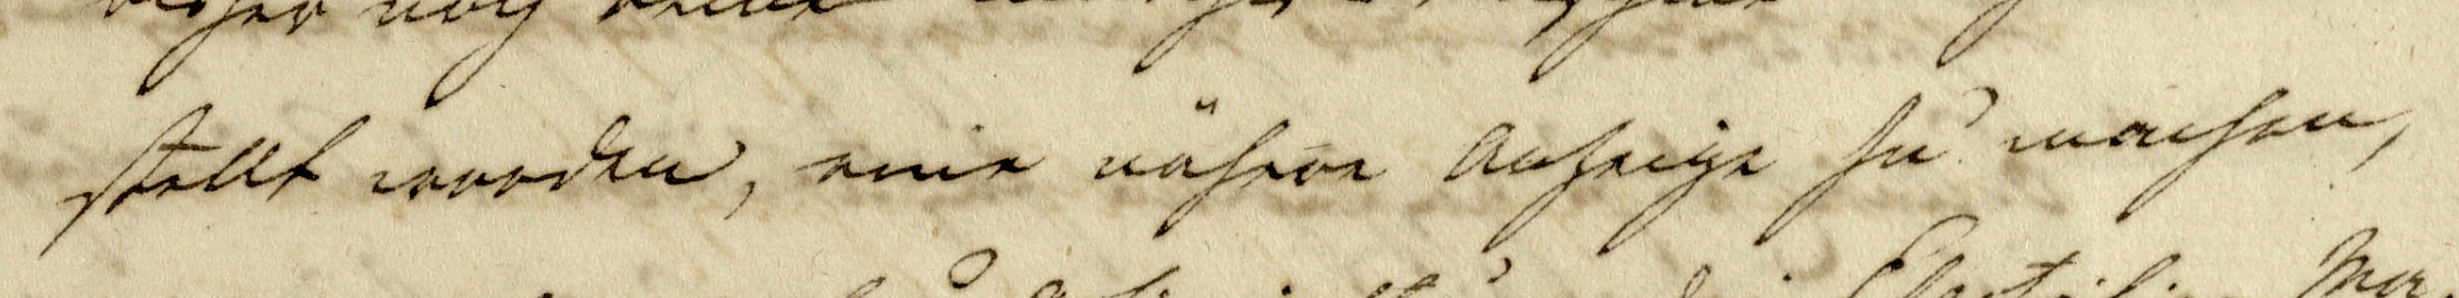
stellt worden, eine nähere Anzeige zu machen,
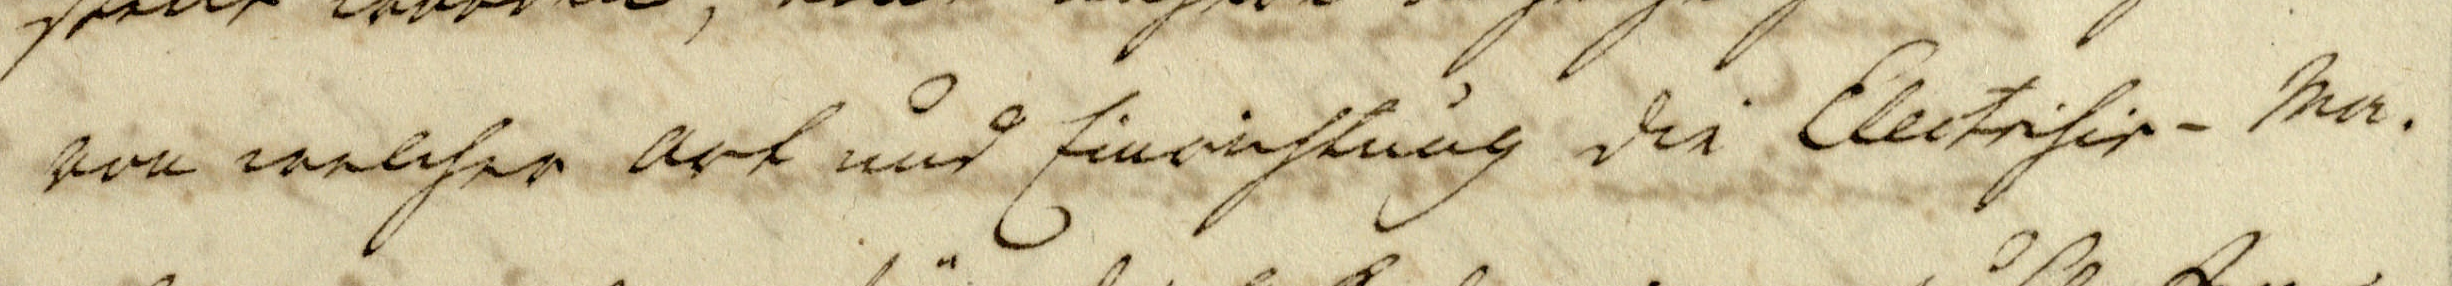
von welcher Art und Einrichtung die Electrisir- Ma¬
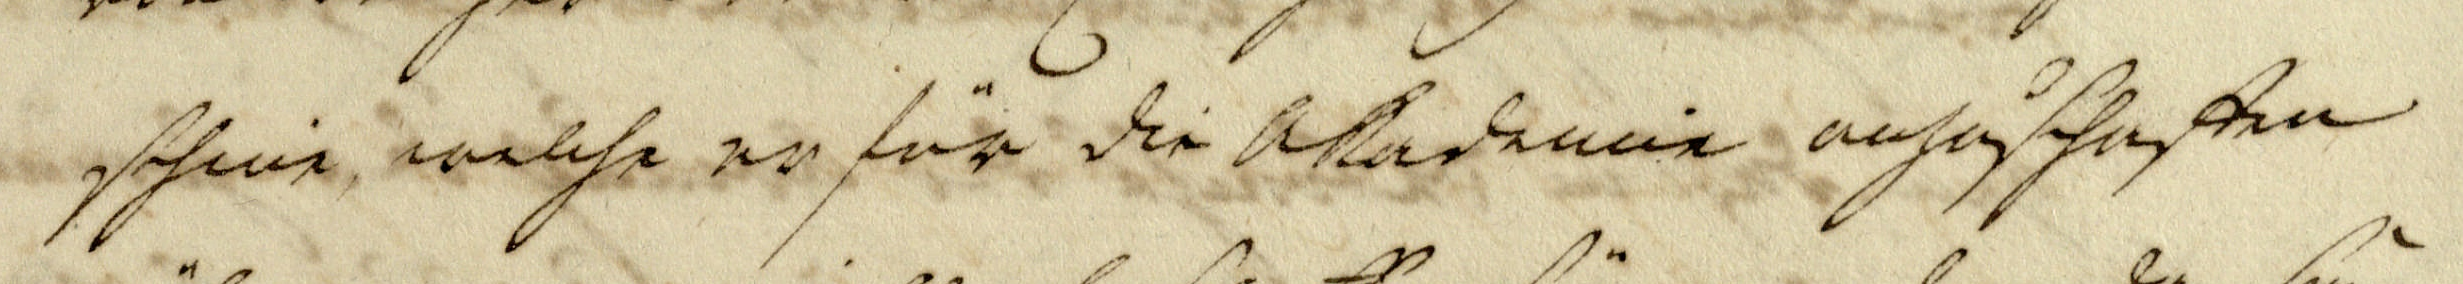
schine, welche er für die Akademie anzuschaffen
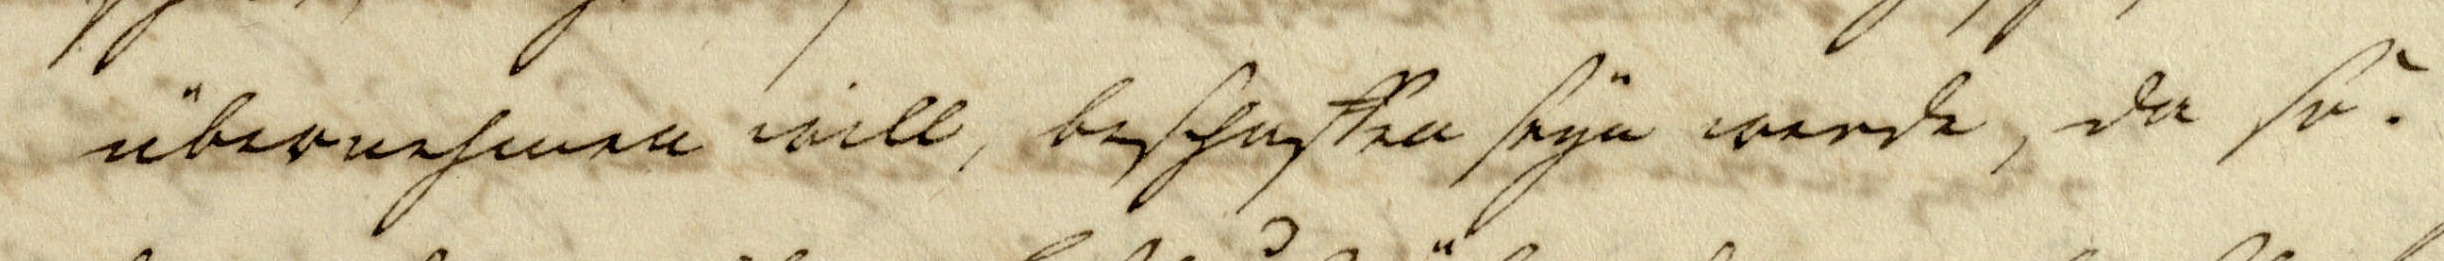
übernehmen will, beschaffen seÿn werde, da so¬
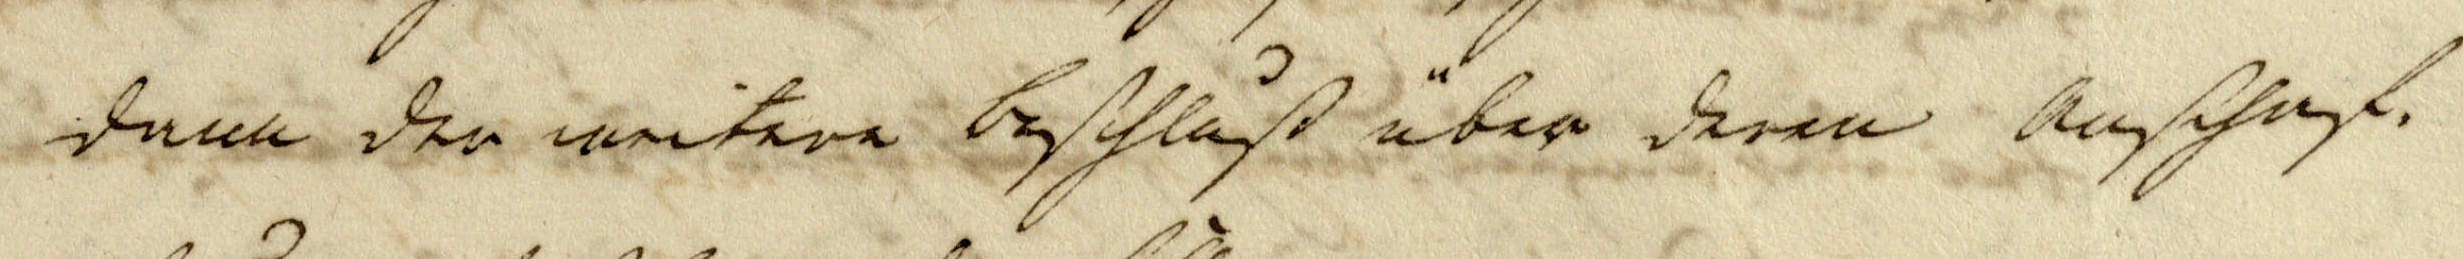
dann der weitere Beschluß über deren Anschaf¬
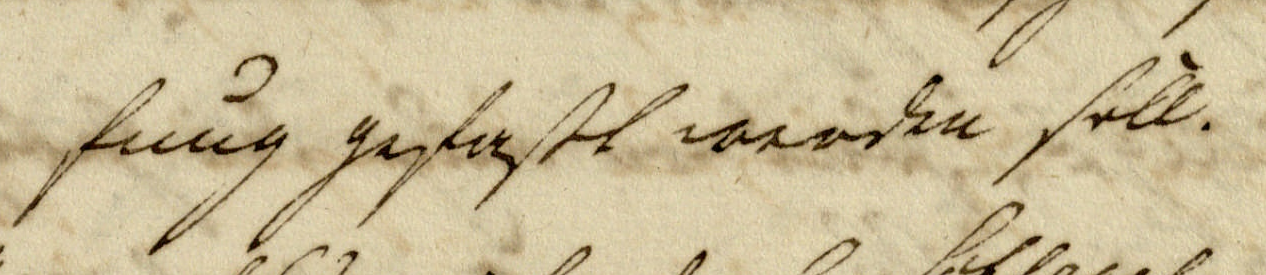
fung gefaßt werden soll.
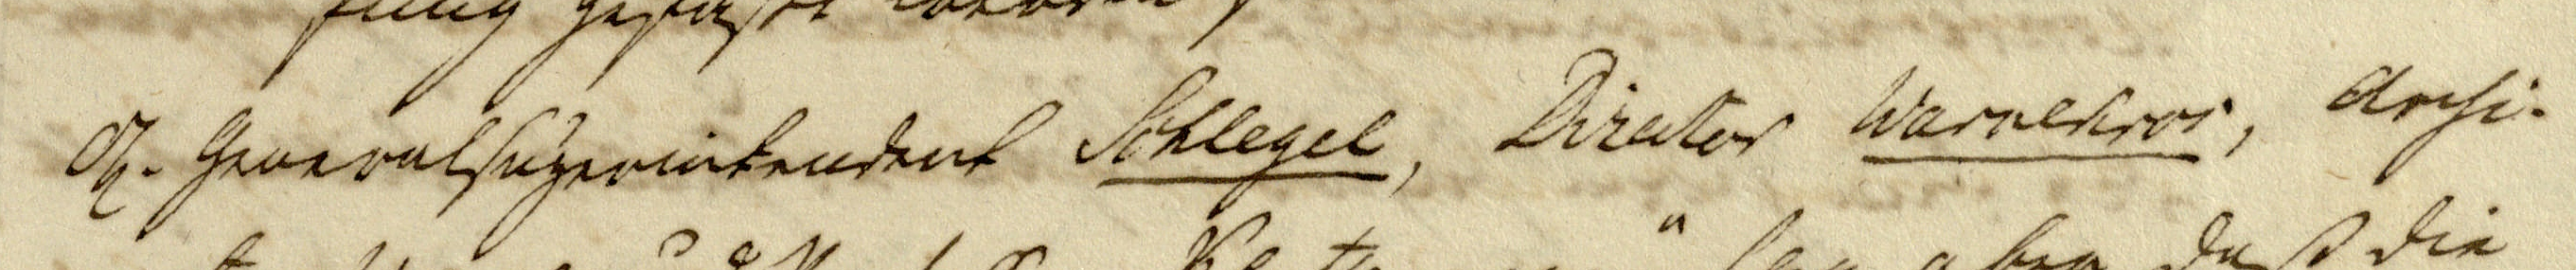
dh. Generalsuperintendent Schlegel, Director Warnekros, Archi¬
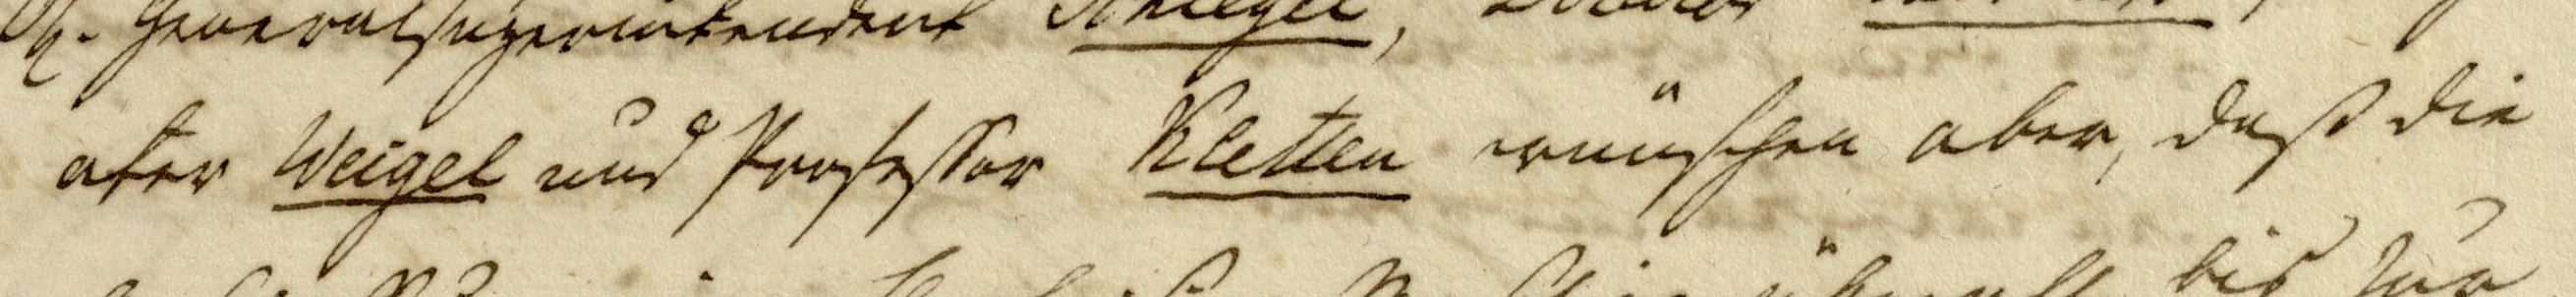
ater Weigel und Professor Kletten wünschen aber, daß die
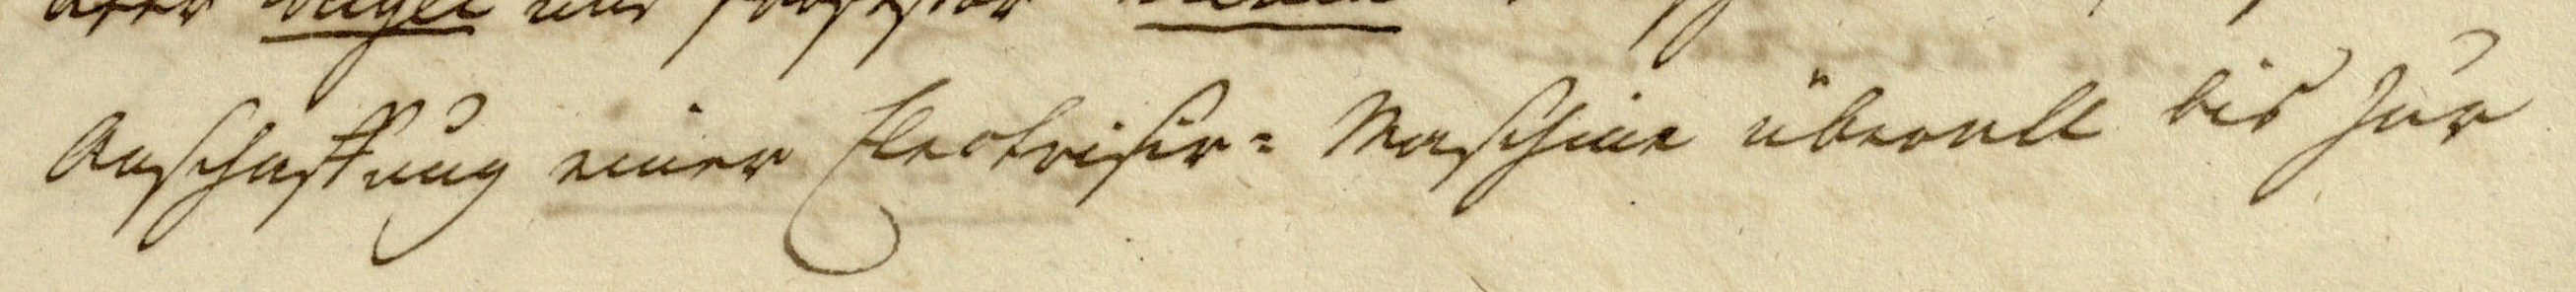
Anschaffung einer Electrisir- Maschine überall bis zur
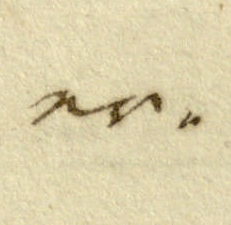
er¬
